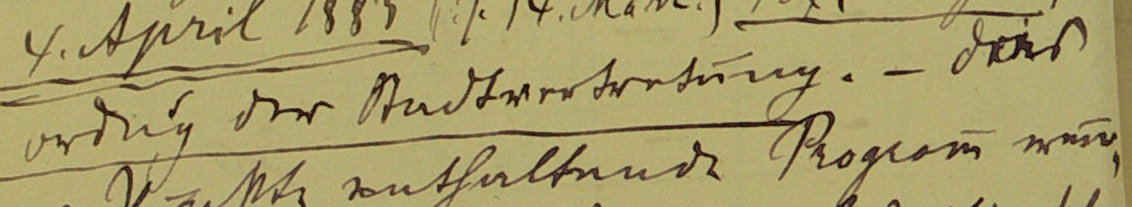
ordnung der Stadtvertretung.--- Dieses
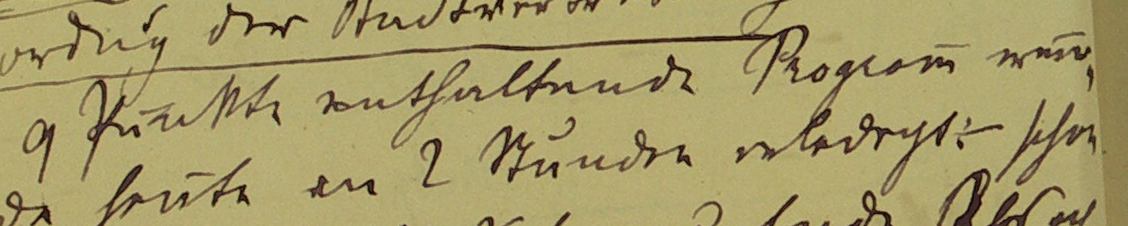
9 Punkte enthaltende Programm wur¬
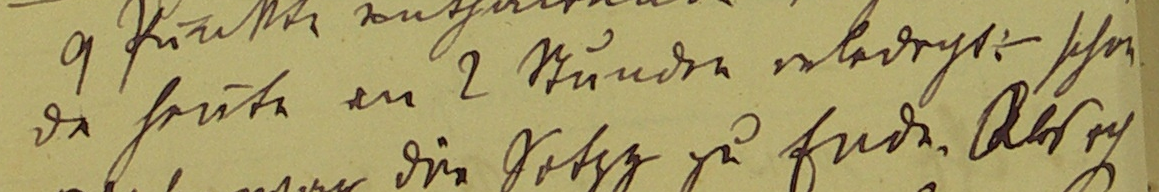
de heute in 2 Stunden erledigt:-schon
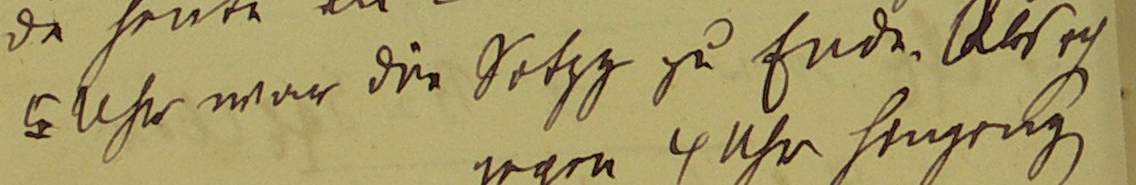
5 Uhr war die Sitzung zu Ende. Als ich
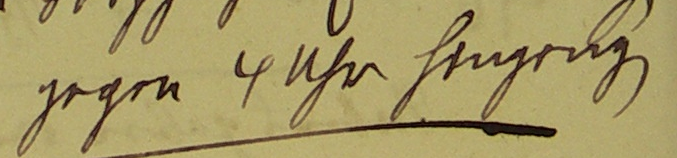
gegen 4 Uhr hinging
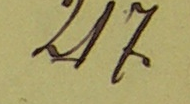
217
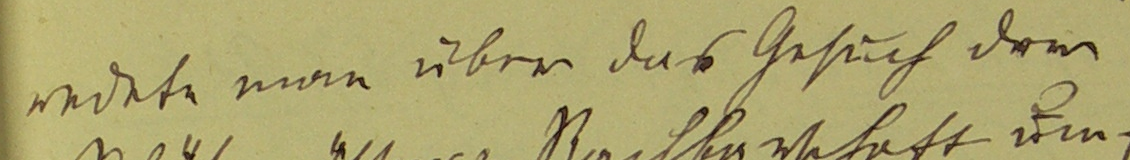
redete man über das Gesuch der
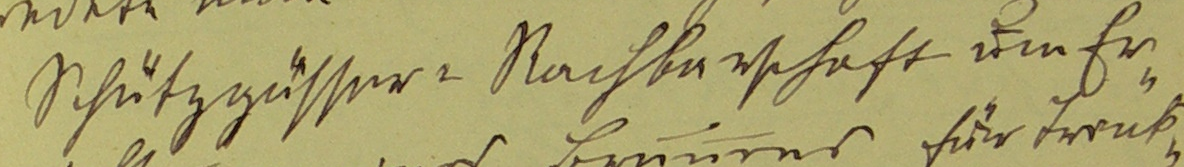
Schützgässer Nachbarschaft um Er¬
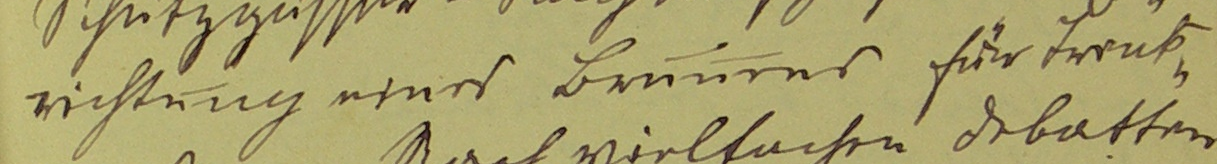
richtung eines Brunnens für Trink¬
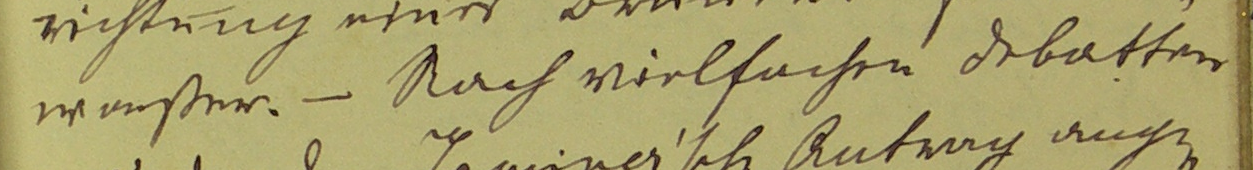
wasser.- Nach vielfachen Debatten
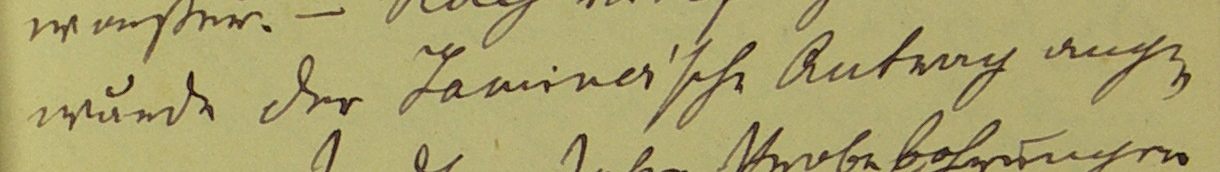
wurde der Taminer´sche Antrag ange¬
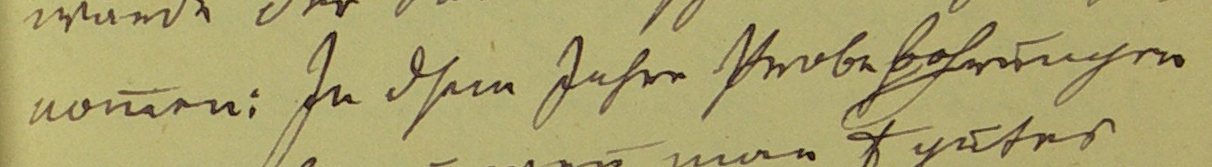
nommen: In diesem Jahr Probebohrungen
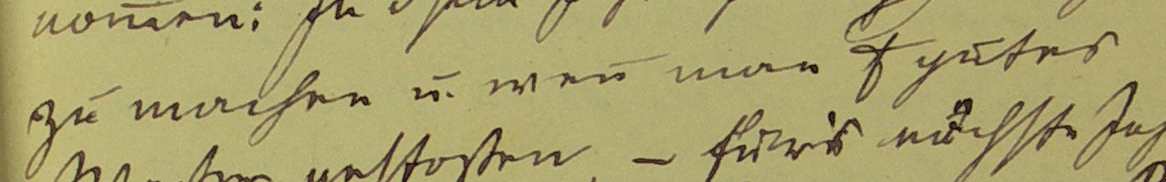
zu machen und wenn man auf gutes
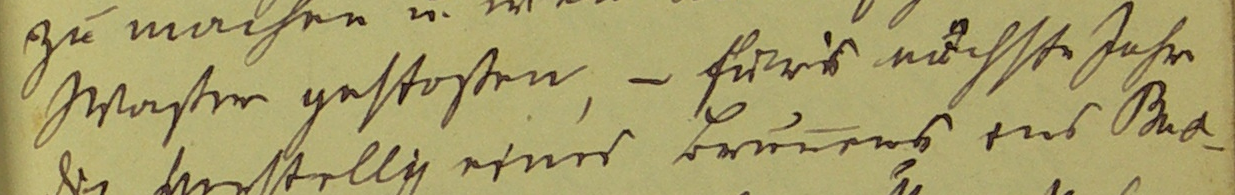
Wasser gestoßen,-- für`s nächste Jahr
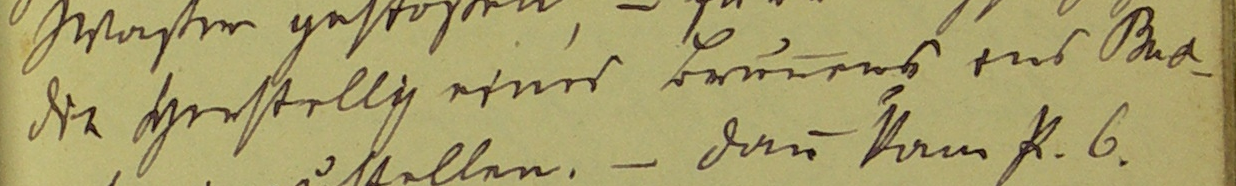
die Herstellung eines Brunnens ins Bud¬
